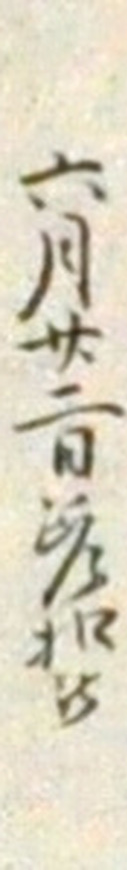六月廿二日差扣被
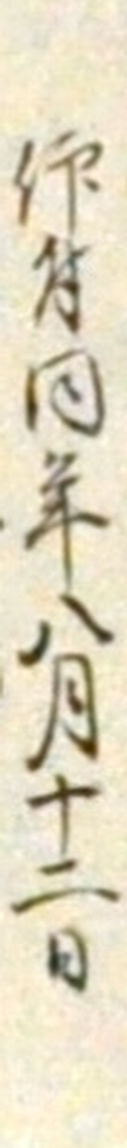仰付同年八月十二日
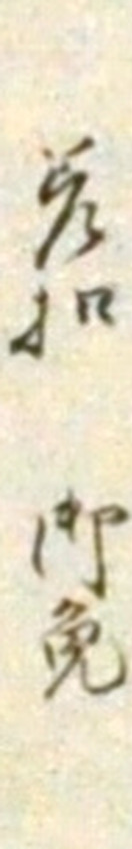差扣御免
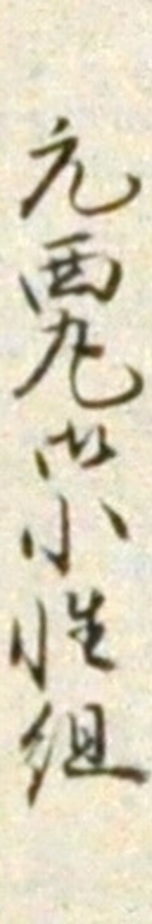元西丸御小姓組
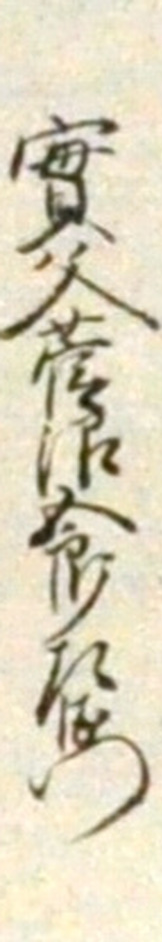實父菅沼五郎左衛門
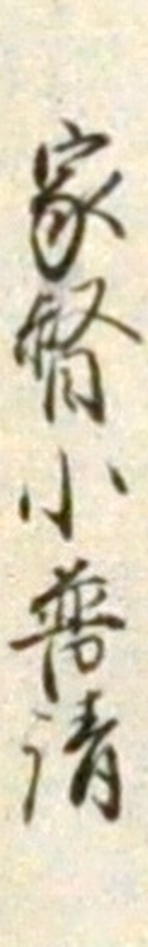家督小普請
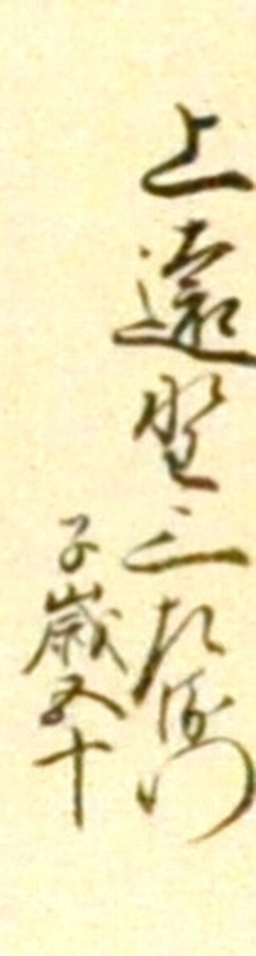子歳五十
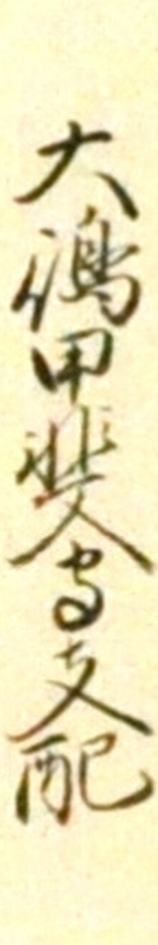大嶋甲斐守支配
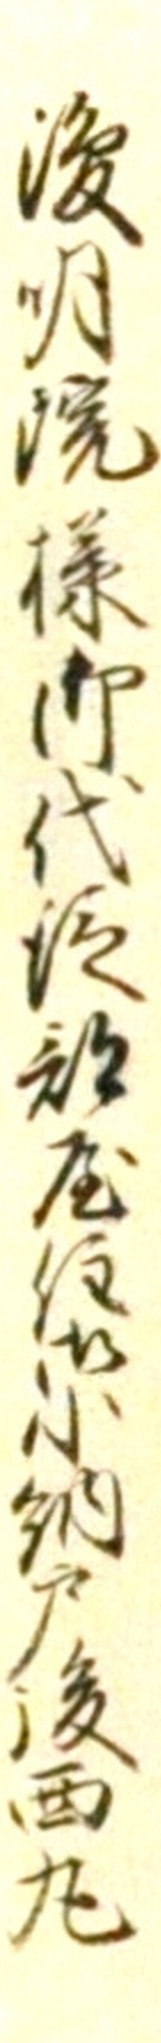浚明院様御代従部屋住御小納戸後西丸

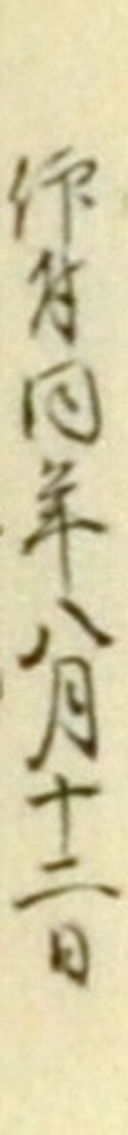仰付同年八月十二日
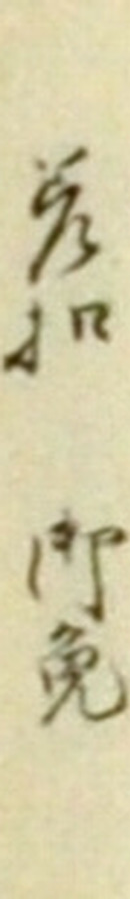差扣御免
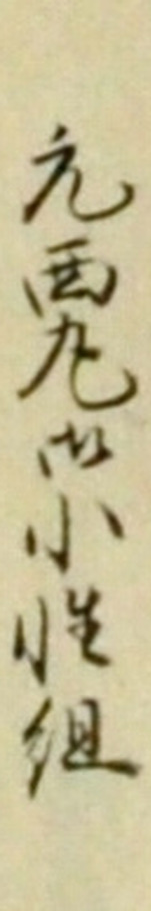元西丸御小姓組
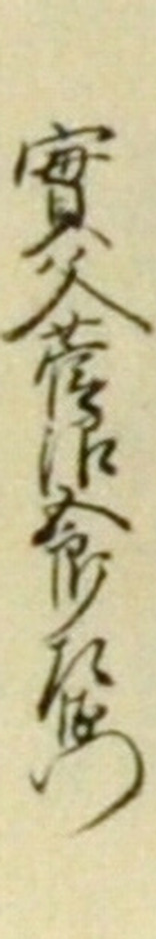實父菅沼五郎左衛門
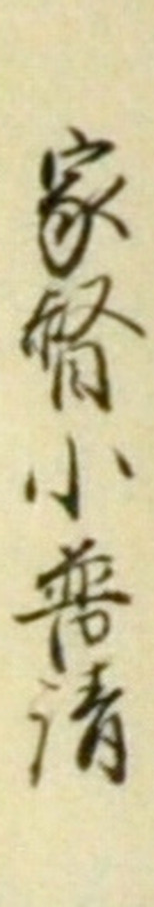家督小普請
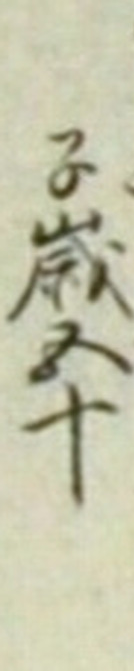子歳五十
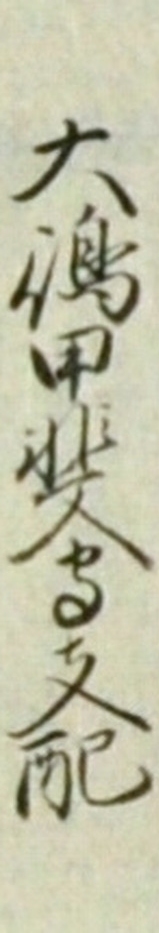大嶋甲斐守支配
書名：若年寄御役中御調書付
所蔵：伊那市立高遠町図書館・合同会社AMANE
